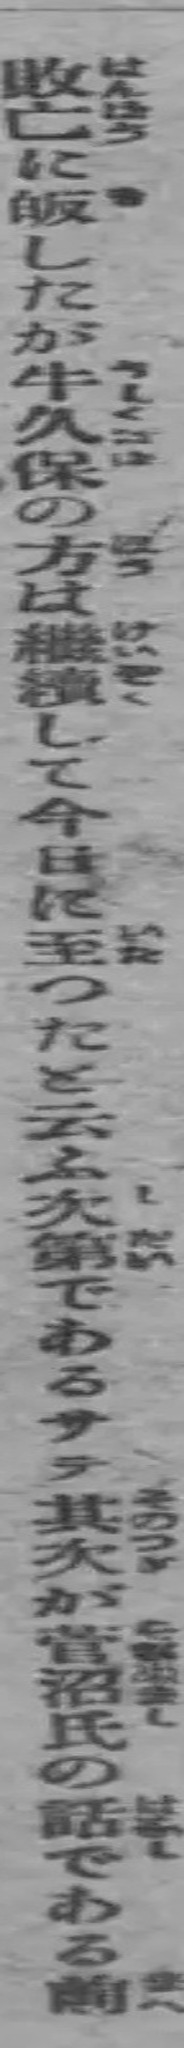敗亡に皈したが牛久保の方は継続して今日に至つたと云ふ次第であるサテ其次が菅沼氏の話である前
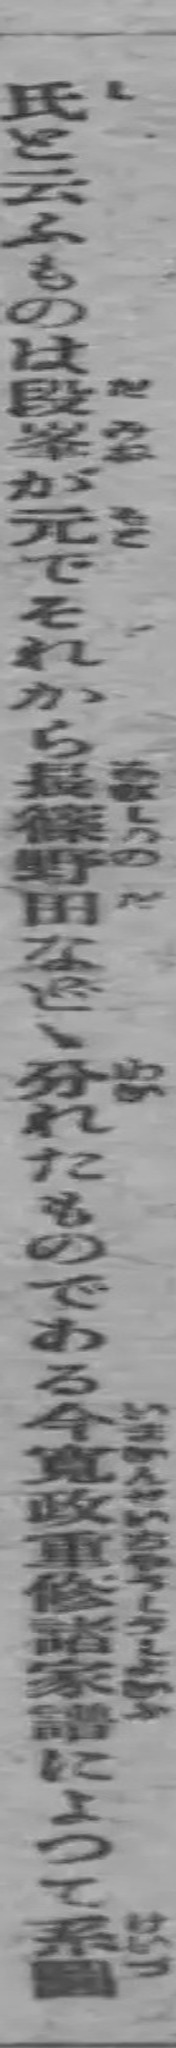氏と云ふものは段峯が元でそれから長篠野田などゝ分れたものである今寛政重修諸家譜によつて系図
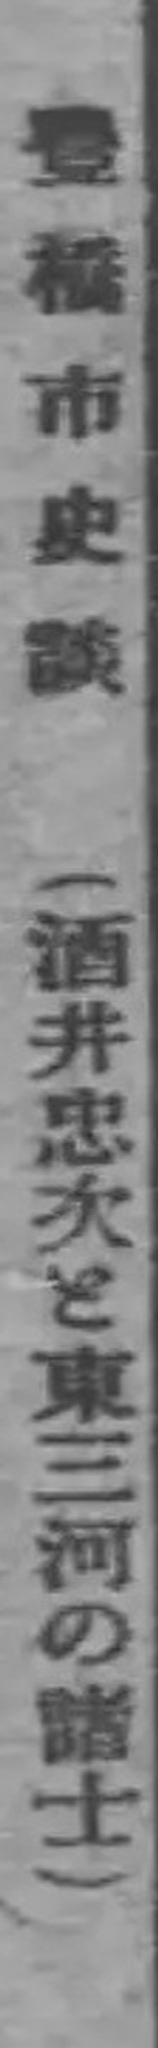豊橋市史談(酒井忠次と東三河の諸士)九十

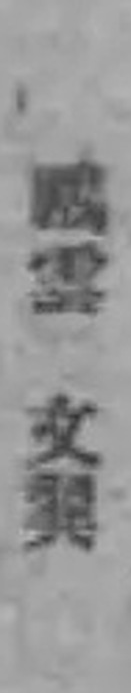某雲文翼
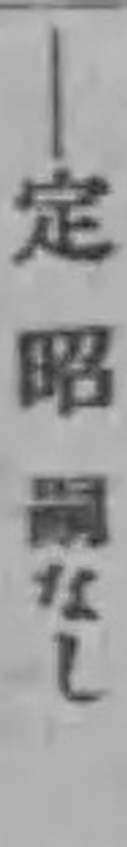定昭嗣なし
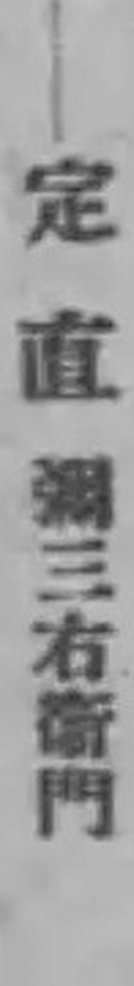定直弥三右衛門
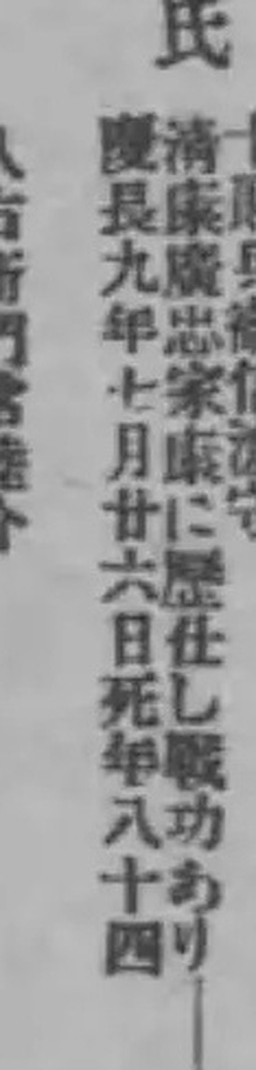慶長九年七月廿六日死年八十四
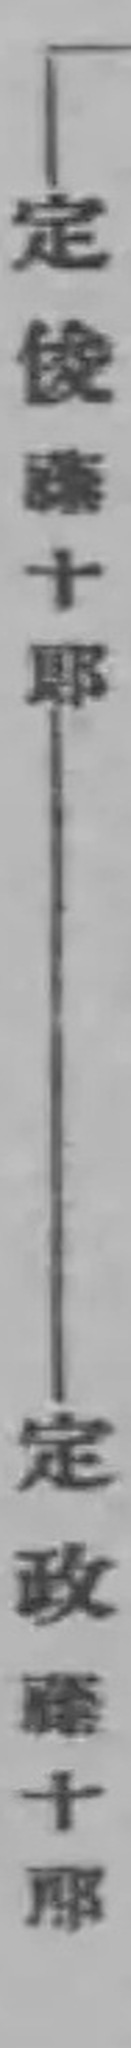定俊藤十郎定政藤十郎

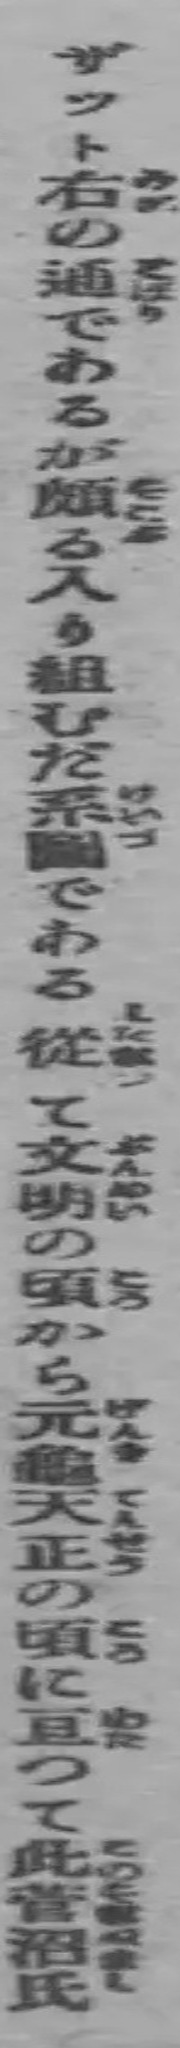ザツト右の通であるが頗る入り組むだ系図である従て文明の頃から元亀天正の頃に亘つて此菅沼氏
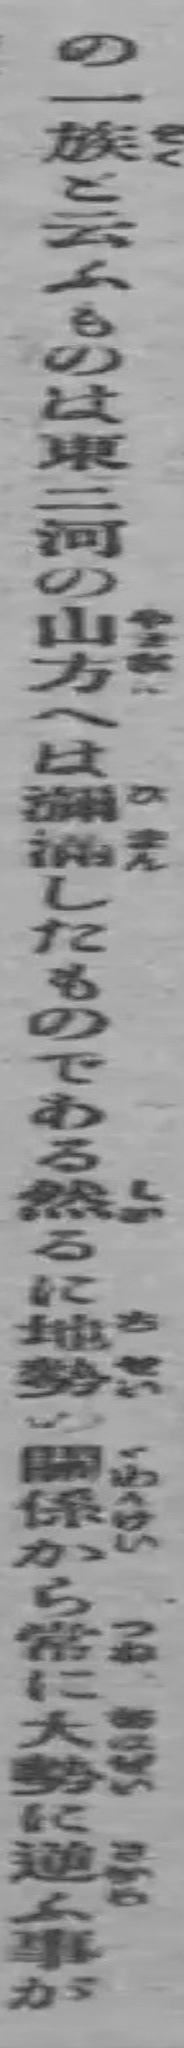の一族と云ふものは東三河の山方へは瀰満したものである然るに地勢の関係から常に大勢に逆ふ事が
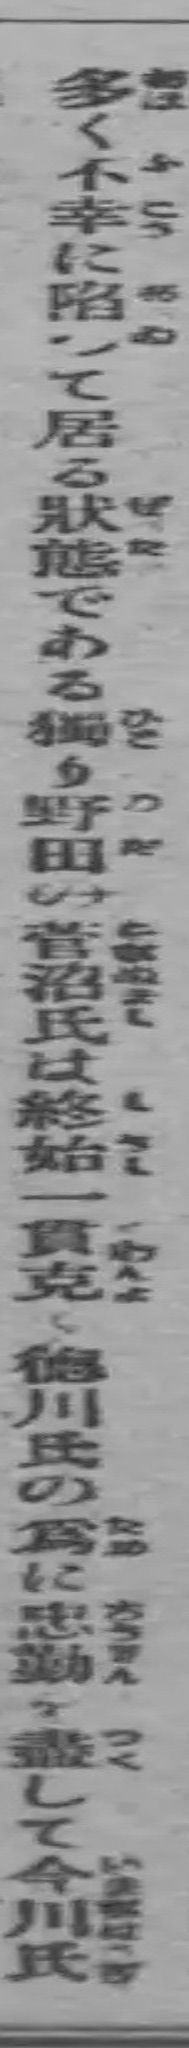多く不幸に陥つて居る状態である独り野田の菅沼氏は終始一貫克く徳川氏の為に忠勤を尽して今川氏
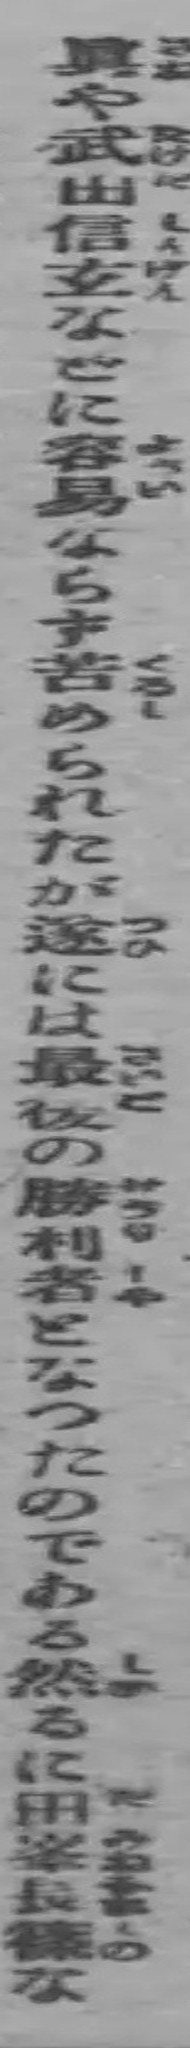実や武田信玄などに容易ならず苦められたが遂には最後の勝利者となつたのである然るに田峯長篠な
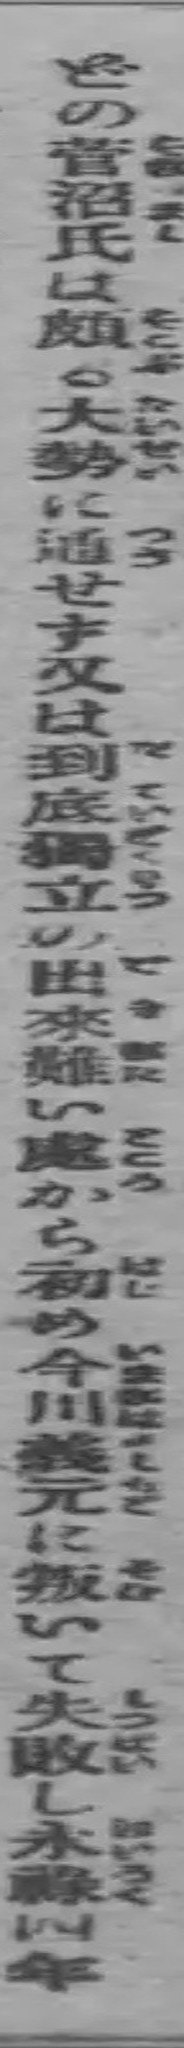どの菅沼氏は頗る大勢に通せず又は到底独立の出来難い処から初め今川義元に叛いて失敗し永禄四年
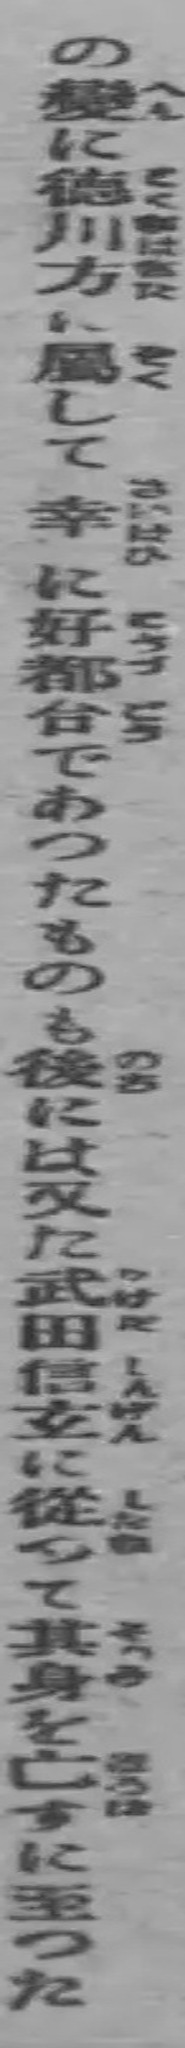の変に徳川方に属して幸に好都合であつたものも後には又た武田信玄に従つて其身を亡すに至つた
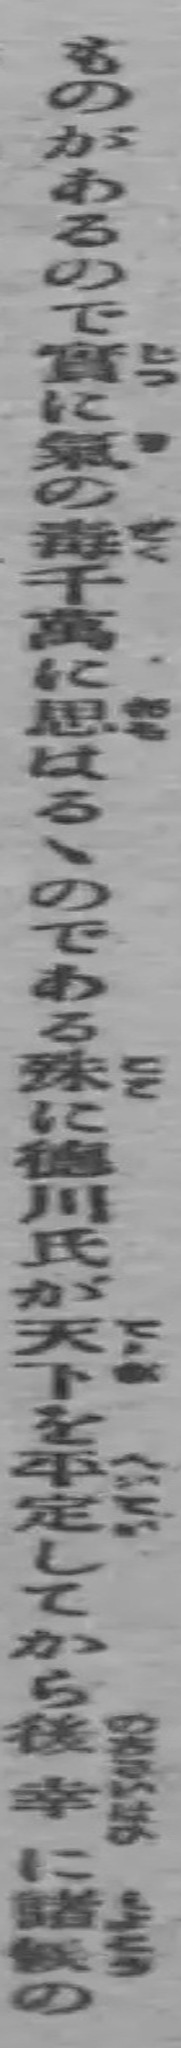ものがあるので実に気の毒千万に思はるゝのである殊に徳川氏が天下を平定してから後幸に諸侯の
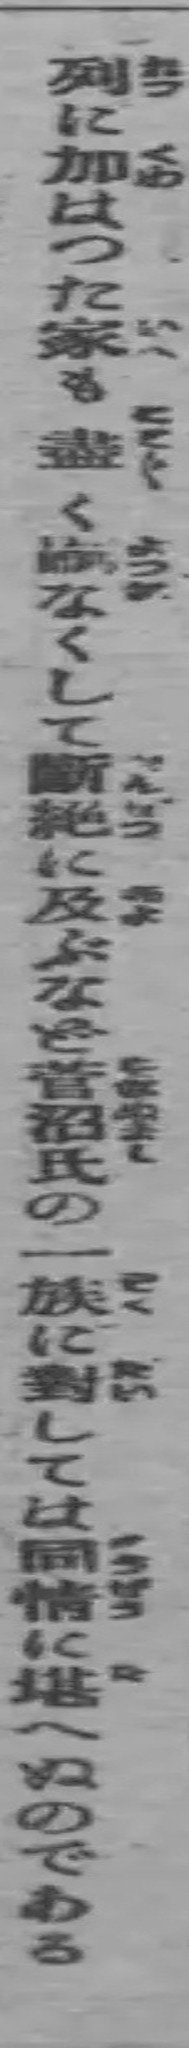列に加はつた家も悉く嗣なくして断絶に及ぶなど菅沼氏の一族に対しては同情に堪へぬのである
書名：豊橋市史談
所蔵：国立国会図書館 National Diet Library, JAPAN
